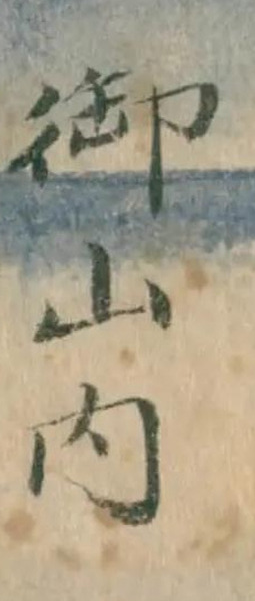御山内

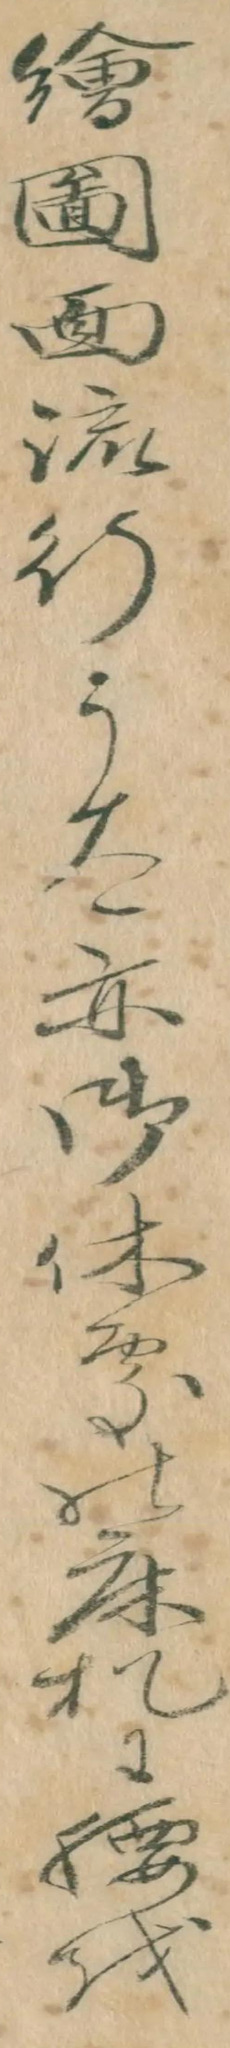絵図面流行うた亦御休處の床机に腰を
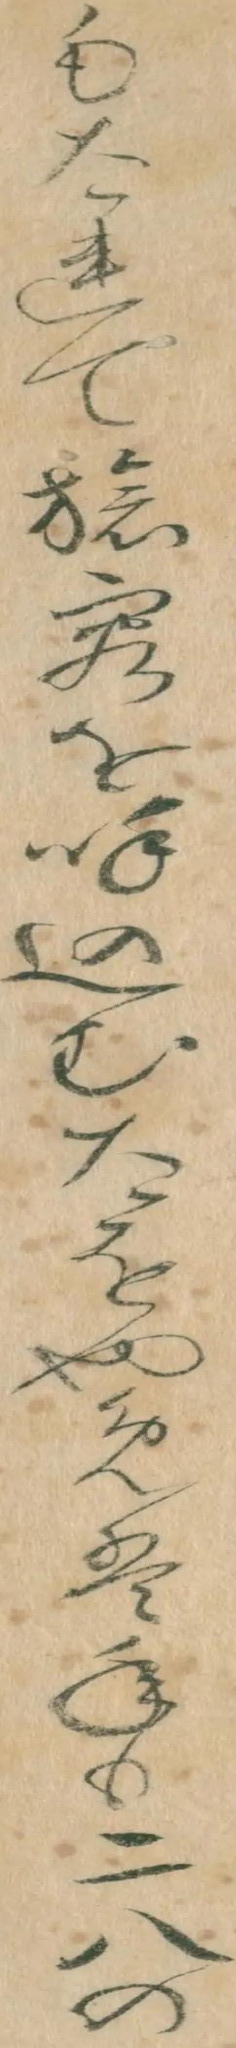もたれて旅客を呼込むたをやめは年も二八の
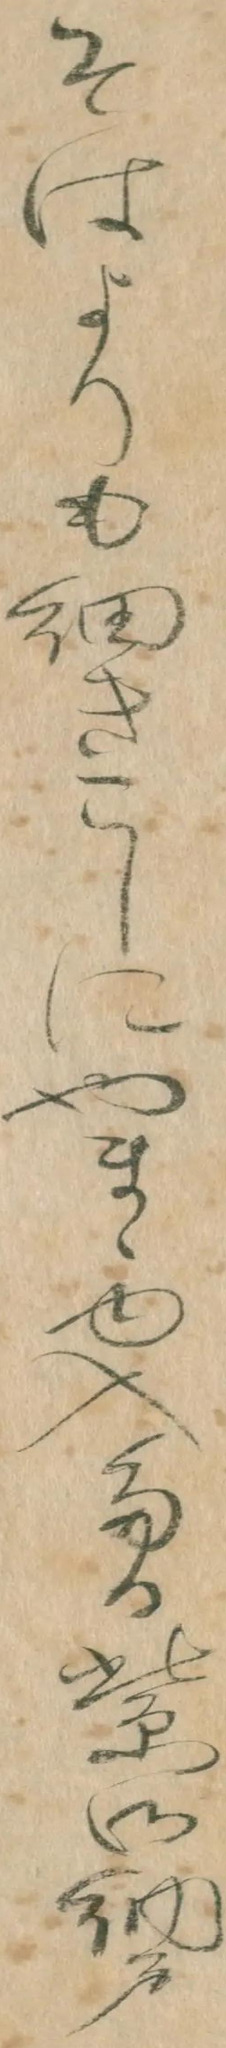そはよりも細きこしにやまゝゆ入たる紫御納戸
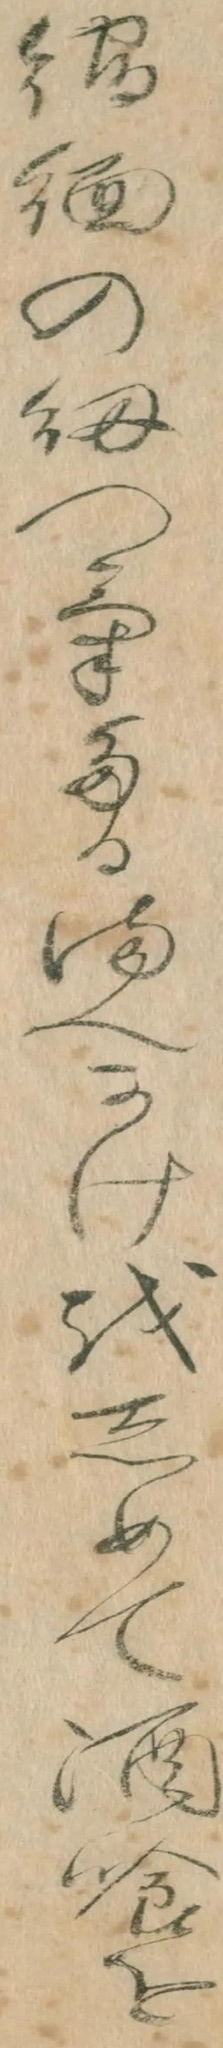縮緬の紐つけたるまへかけをしめて酒喰を
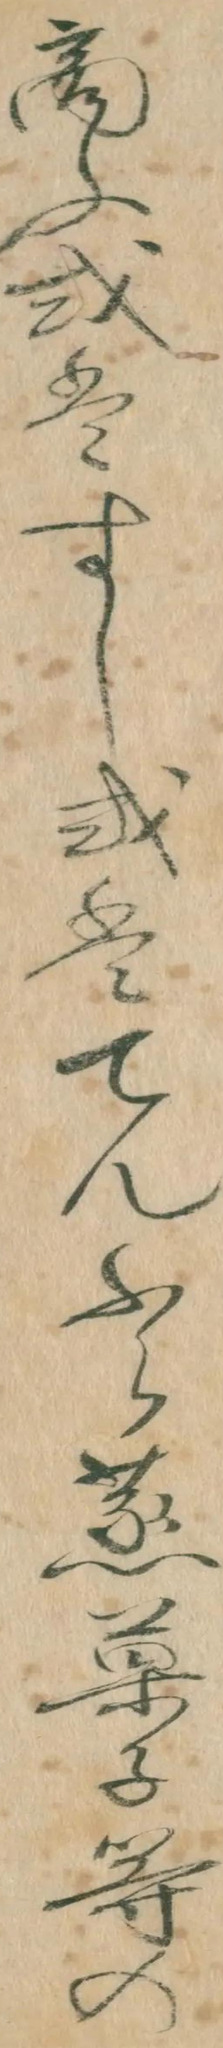商ふ或はすし或るはてんふら蒸菓子等の
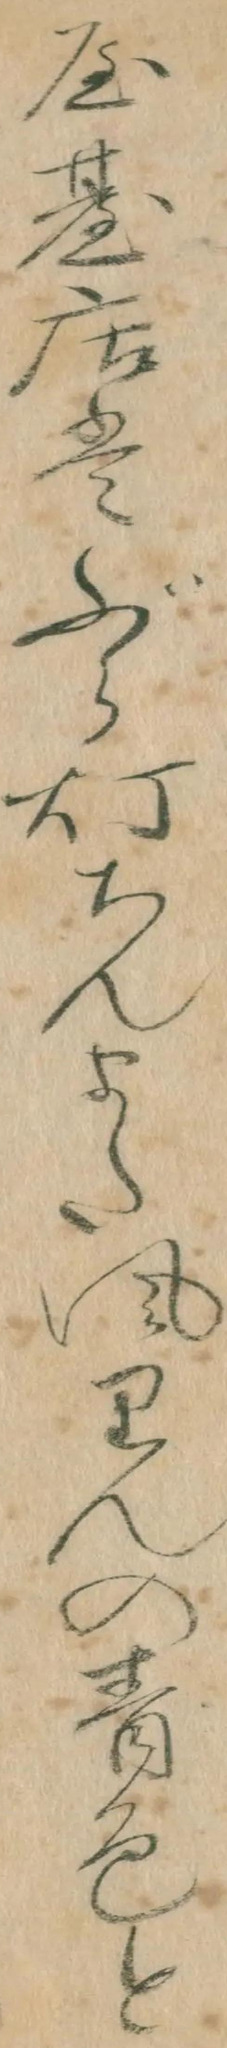屋臺店はぶら灯ちんまた風りんの青色と
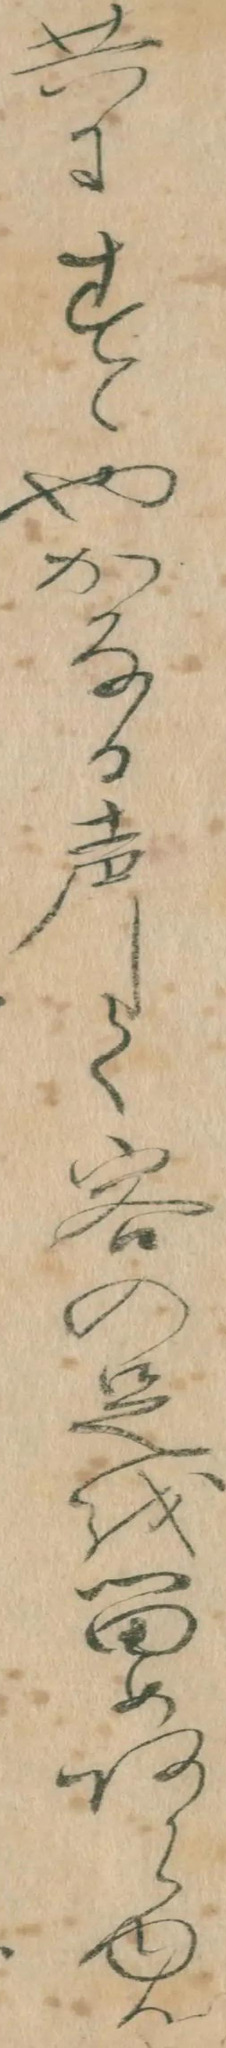共にすゝやかなる声して客の足を留めあらゆる
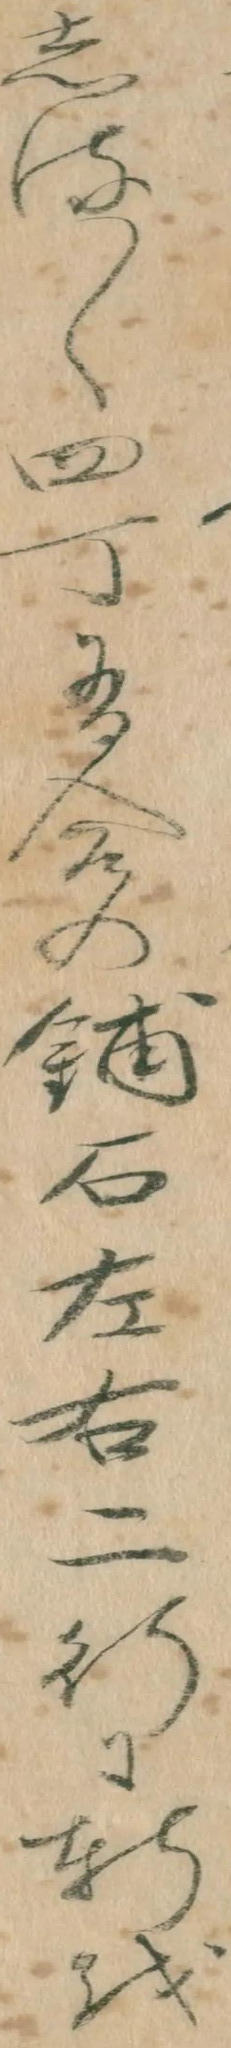しる〳〵四丁有合の鋪石左右二行に軒を
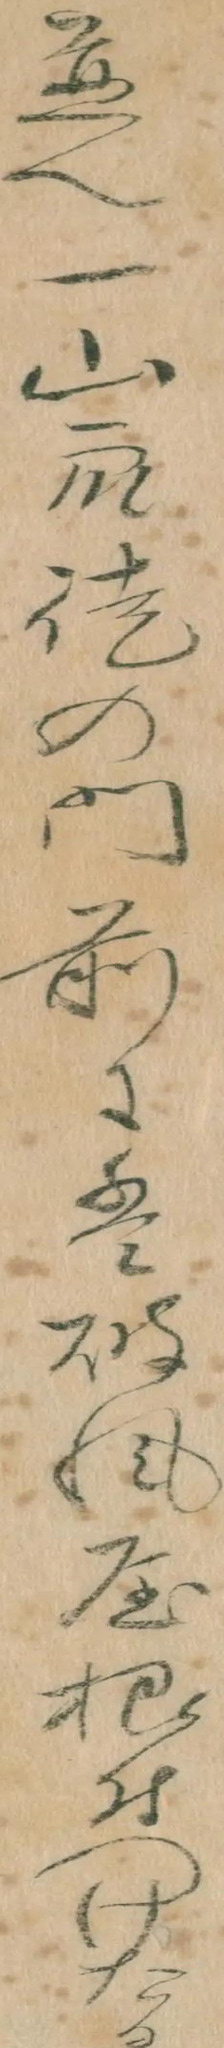並へ一山衆徒の門前には破風屋根付つけたる
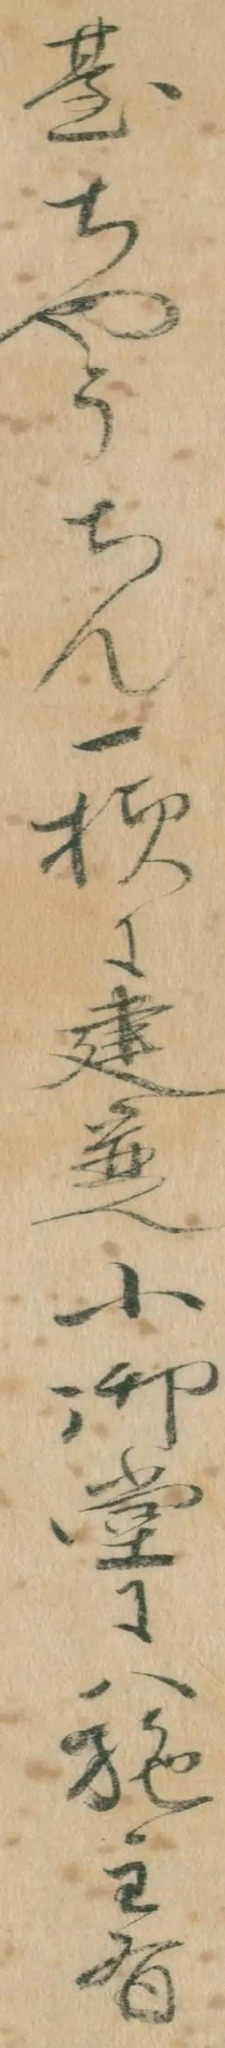臺ちやうちん一様に建並へ小御堂には施主有
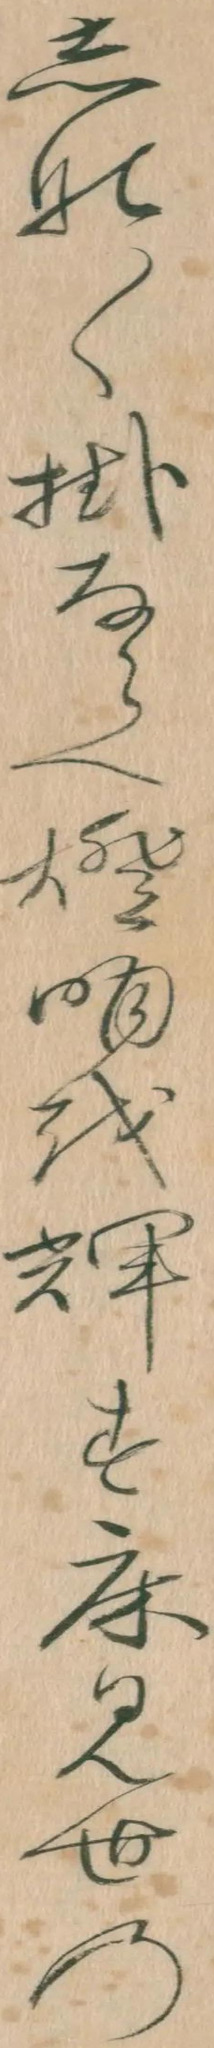しな〳〵掛ならへ燈明を輝す床見世の
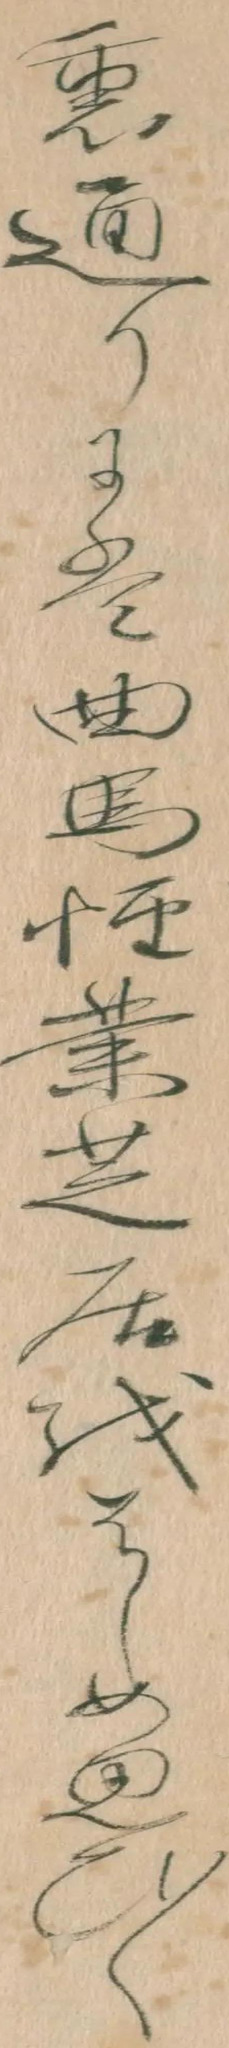裏通りには曲馬軽業芝居をはしめ思ひ〳〵
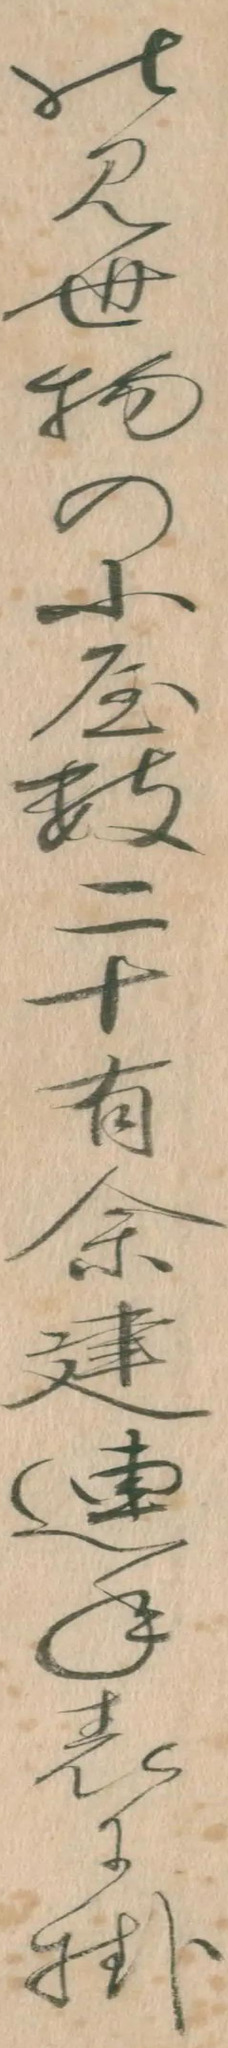の見世物の小屋数二十有余建連ね表に掛
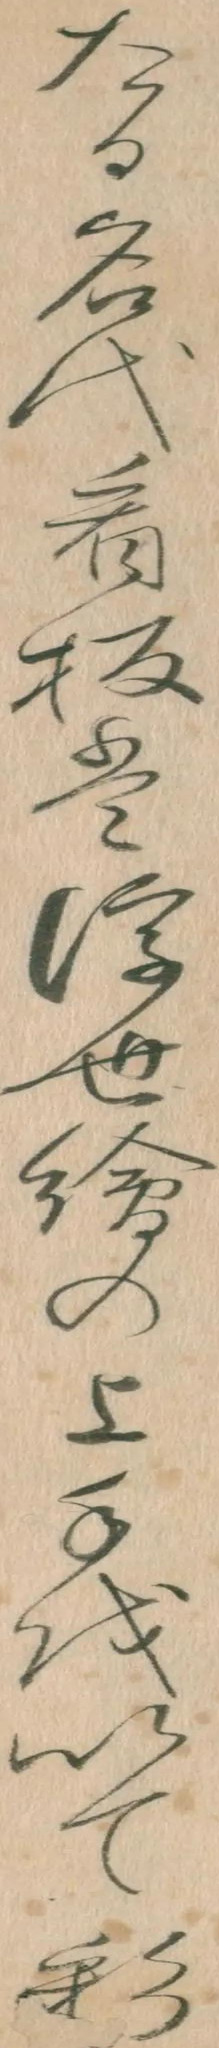たる名代看板は浮世繪の上手を以て彩
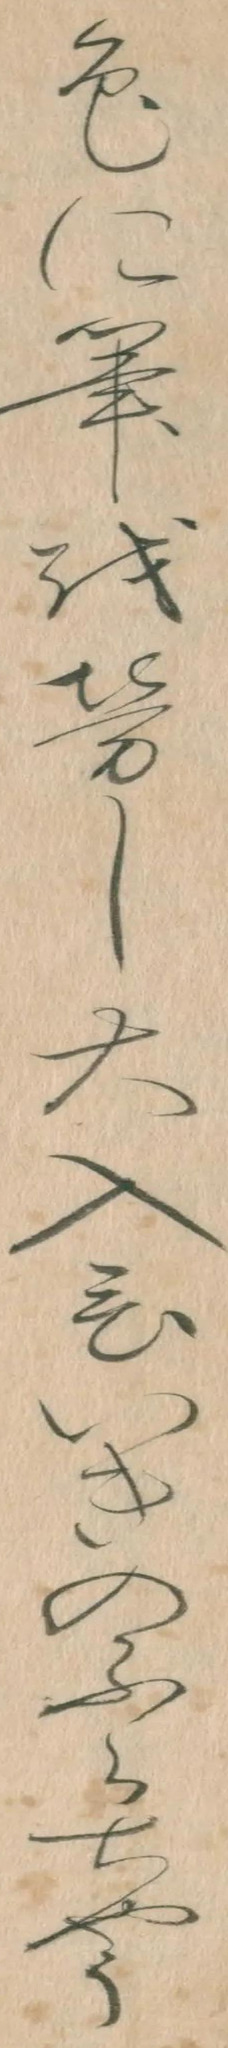色に筆を労し大入ひいきのふるちやう
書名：俗語之種. [2]
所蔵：国立国会図書館 National Diet Library, JAPAN
